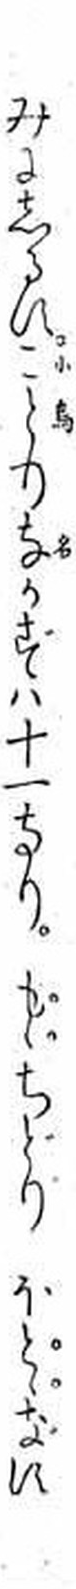みにしるす。ことりなかずは十一なり。もゝちどりほとゝきす
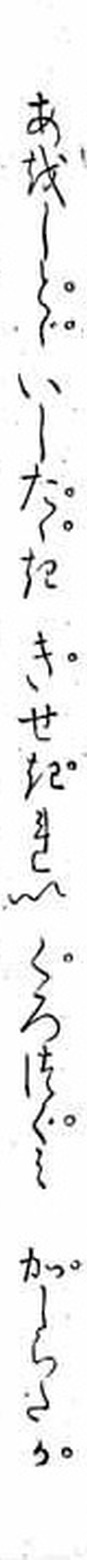あをしとゞいしたゝききせきれいくろつぐみかしらさか
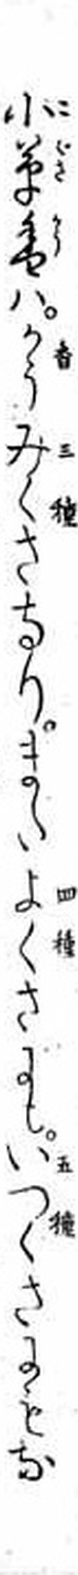小草香は。かうみくさなり。またよくさにも。いつくさにもな
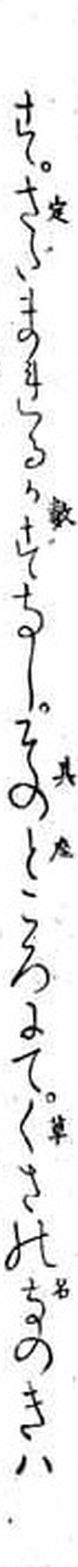す。さだまれるかずなし。そのところにて。くさのなのきは
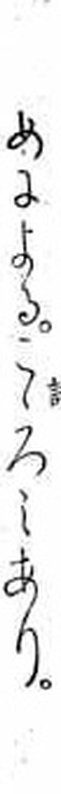めによる。こゝろみあり。
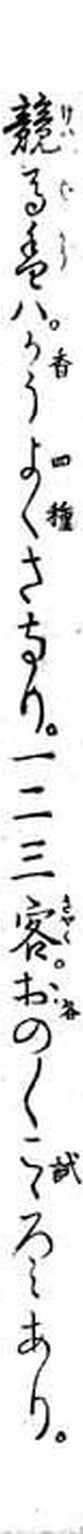競馬香は。かうよくさなり。一二三客。おの〳〵こゝろみあり。

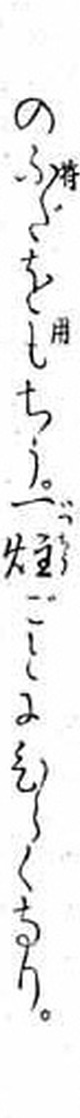のふだをもちう。一炷ごとにひらくなり。
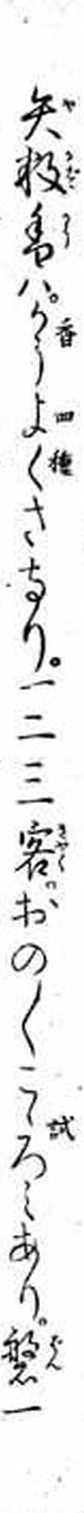矢数香は。かうよくさなり。一二三客。おの〳〵こゝろみあり。磐一
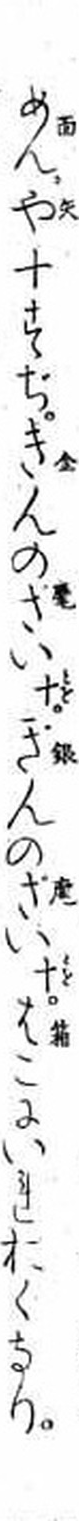めん。や十すぢ。きんのざいぎんのざい十。はこにいれおくなり。
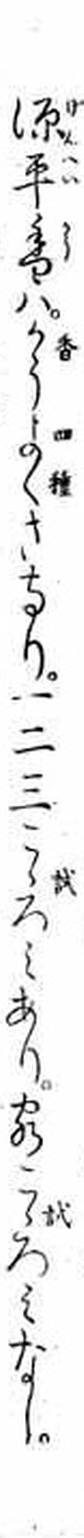源平香は。かうよくさなり。一二三こゝろみあり。客こゝろみなし。
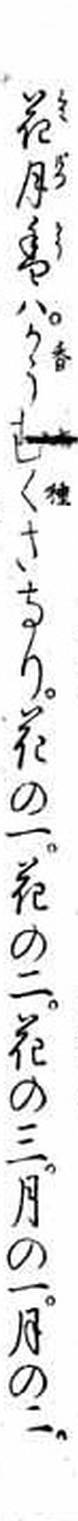花月香は。かうむくさなり。花の一。花の二。花の三。月の一。月の二。
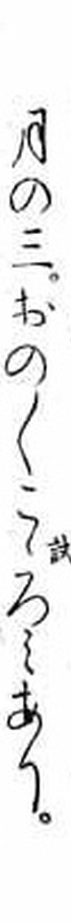月の三。おの〳〵こゝろみあり。
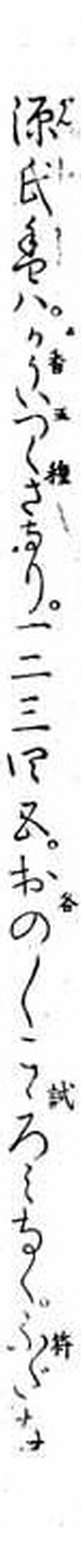源氏香は。かういつくさなり。一二三四五。おの〳〵こゝろみなく。ふだな
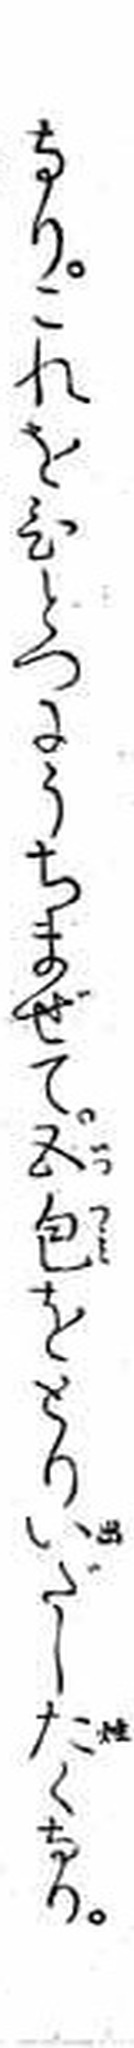なり。これをひとつにうちまぜて。五包をとりいだしたくなり。
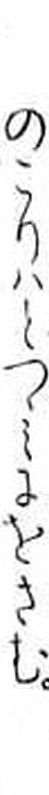のこりはとつゝみにをさむ。
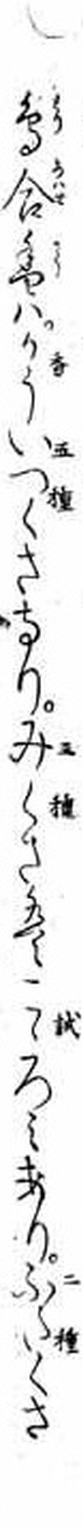鳥合香は。かういつくさなり。みくさはこゝろみあり。ふたくさ
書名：女学範
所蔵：東京学芸大学教育コンテンツアーカイブ
